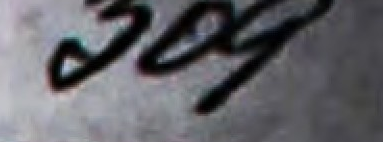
309
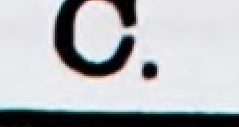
C.
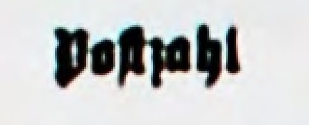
Postzahl
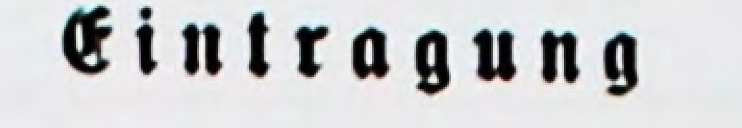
Eintragung
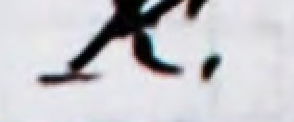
K.
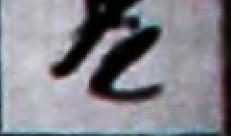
??
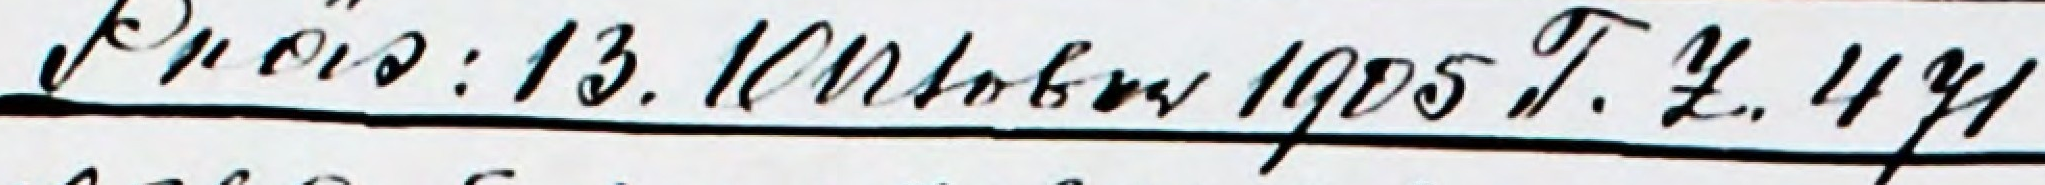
Präs: 13. Oktober 1905 T.Z. 471
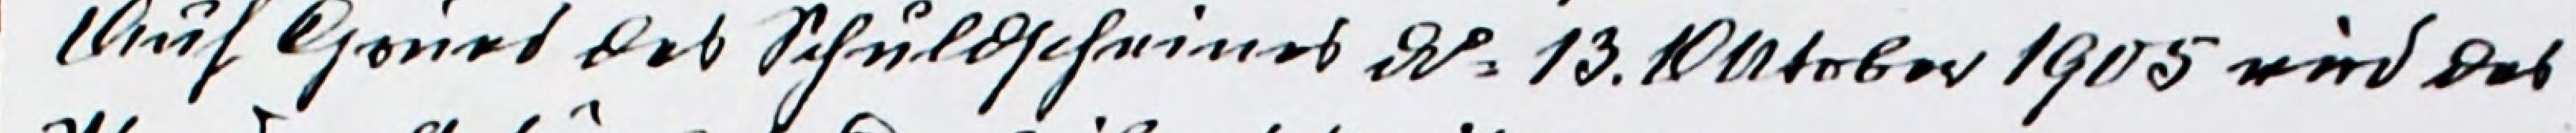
Auf Grund des Schuldscheines ddo 13. Oktober 1905 wird das
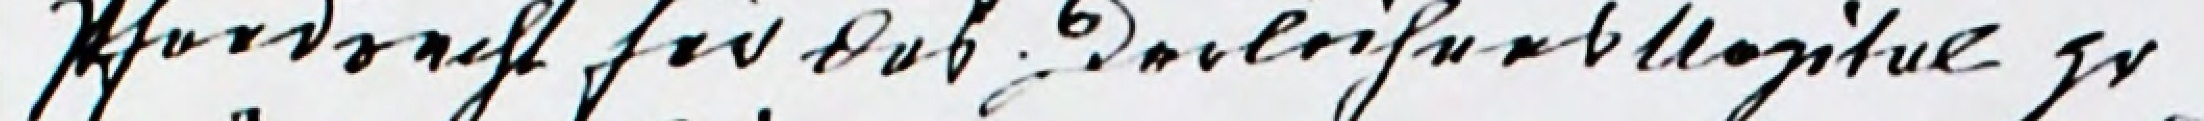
Pfandrecht für des. Darleihenskapital pr
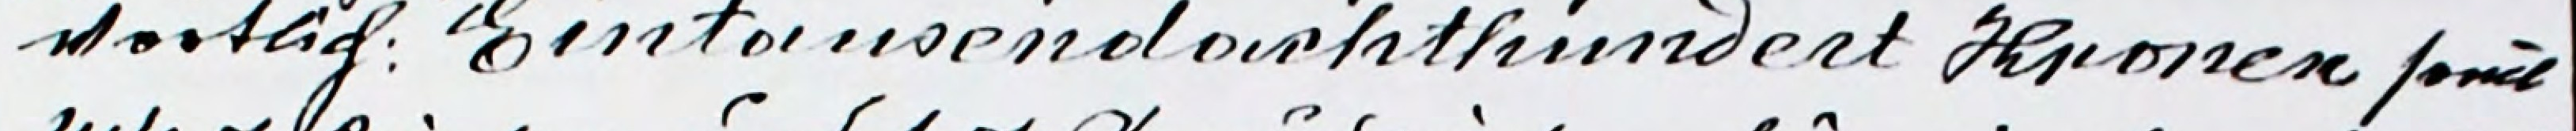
wörtlich: Eintausendachthundert Kronen sammt
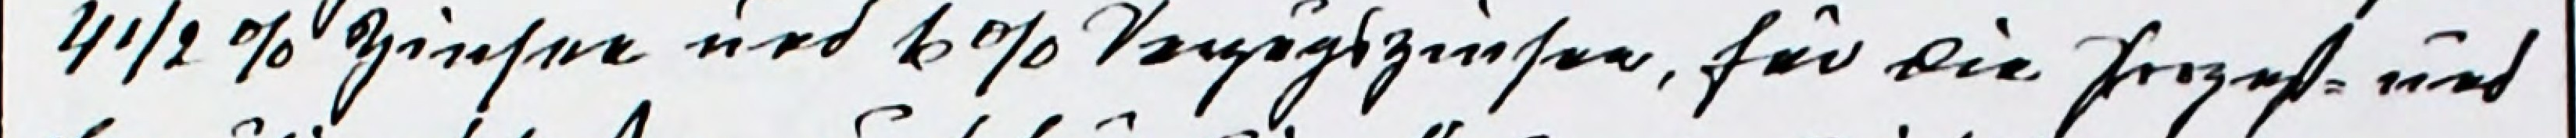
4 1/2 % Zinsen und 6 % Verzugszinsen, für die Porzest= und
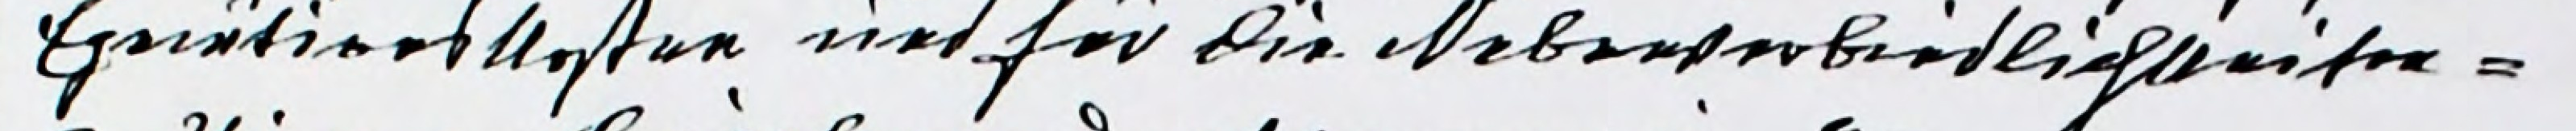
Egnutionskosten und für die Nebenverbindlichkeiten=
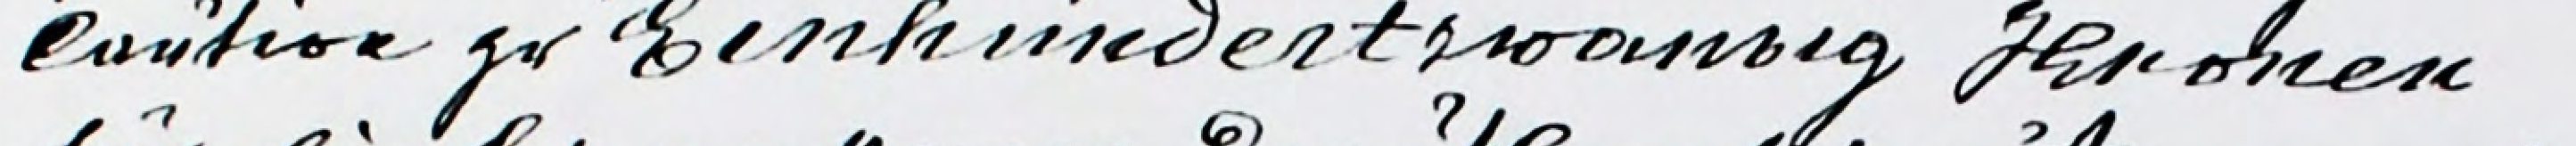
Caution pr Einhundertzwanzig Kronen
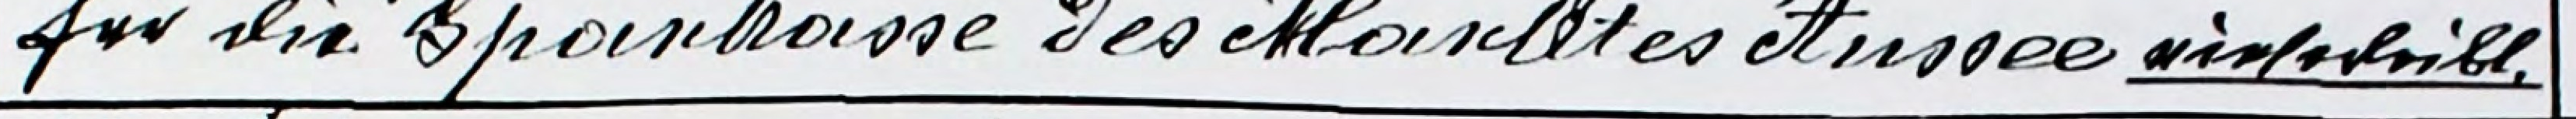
für die Sparkasse des Marktes Aussee einverleibt.
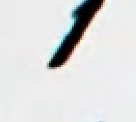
1
